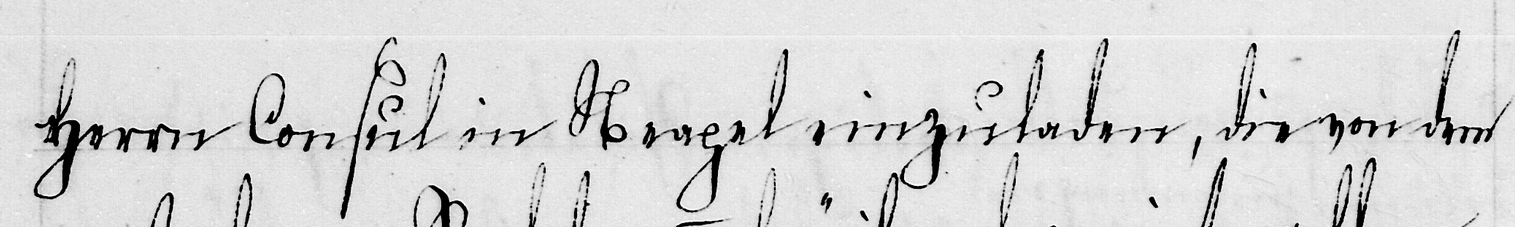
Herrn Consul in Neapel einzuladen, die von dem
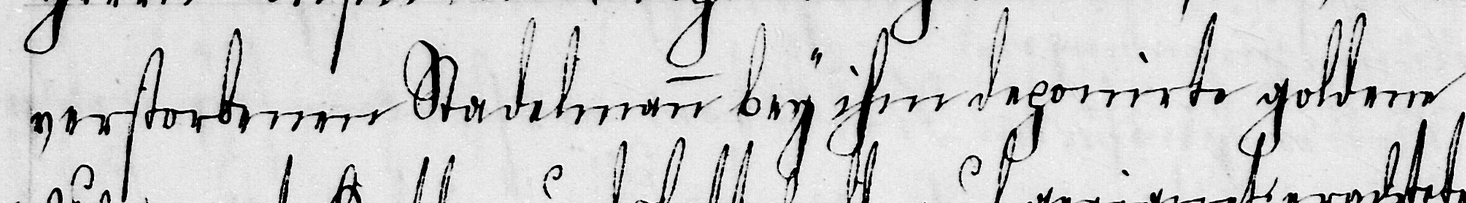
verstorbenen Stadelmann bey ihm deponirte goldene
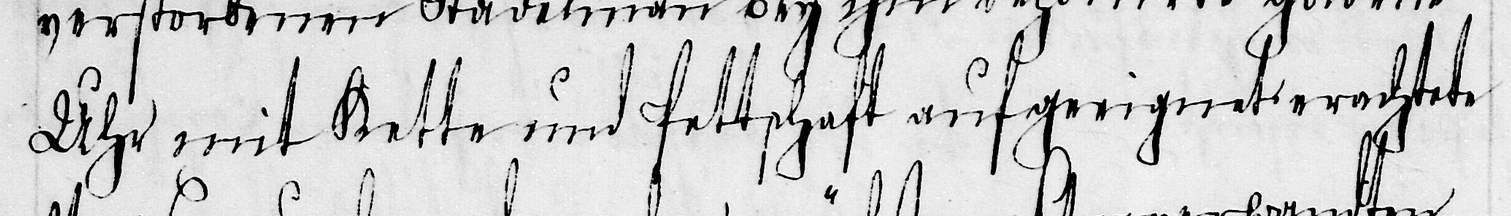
Uhr mit Kette und Pettschaft auf geeignet erachtete
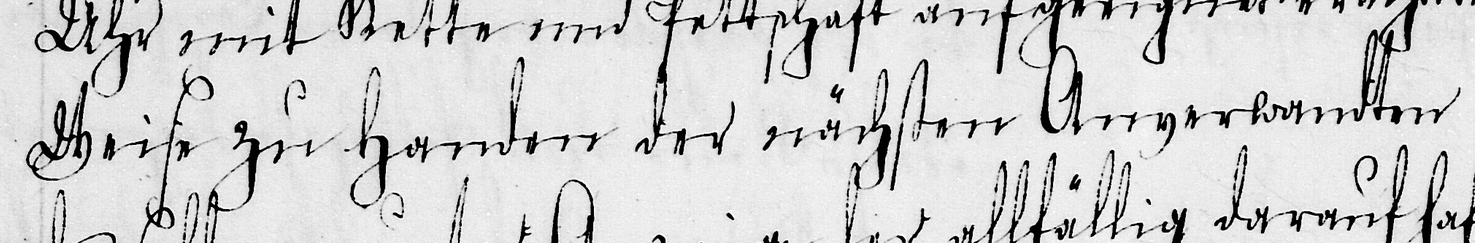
Weise zu Handen der nächsten Anverwandten
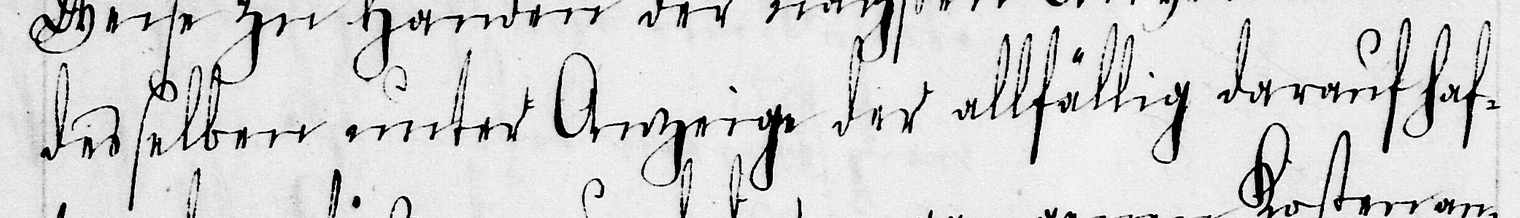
desselben unter Anzeige der allfällig darauf haf¬
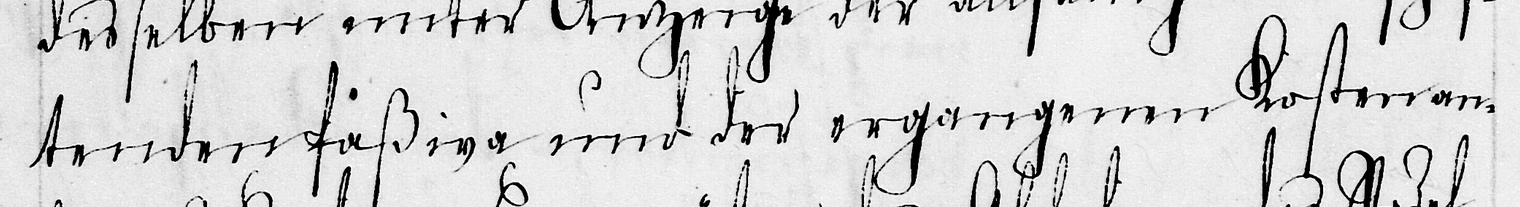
tenden Paßiva und der ergangenen Kosten an¬
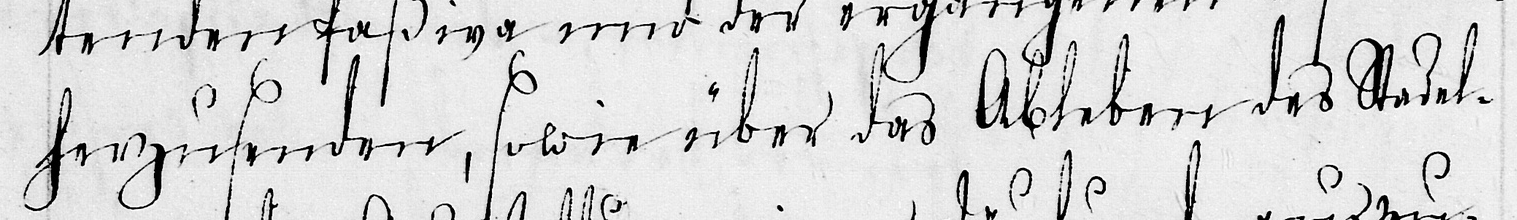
herzusenden, sowie über das Ableben des Stadel¬
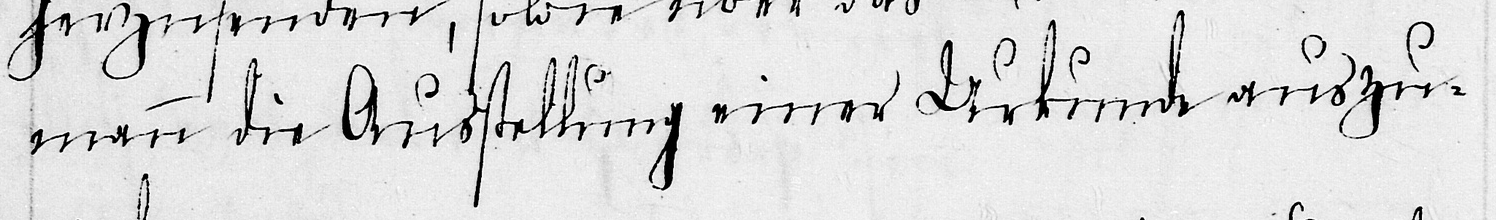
mann die Ausstellung einer Urkunde auszu¬
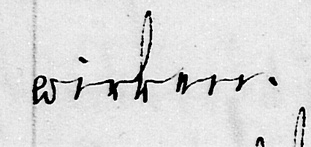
wirken.
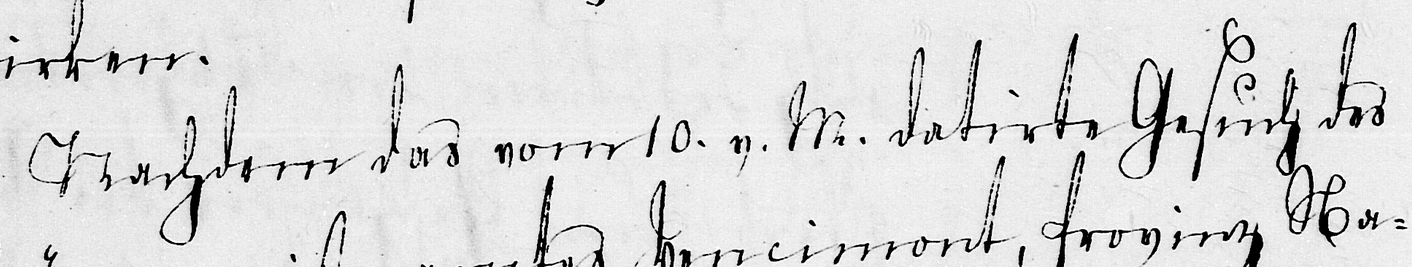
Nachdem das vom 10. v. M. datirte Gesuch des
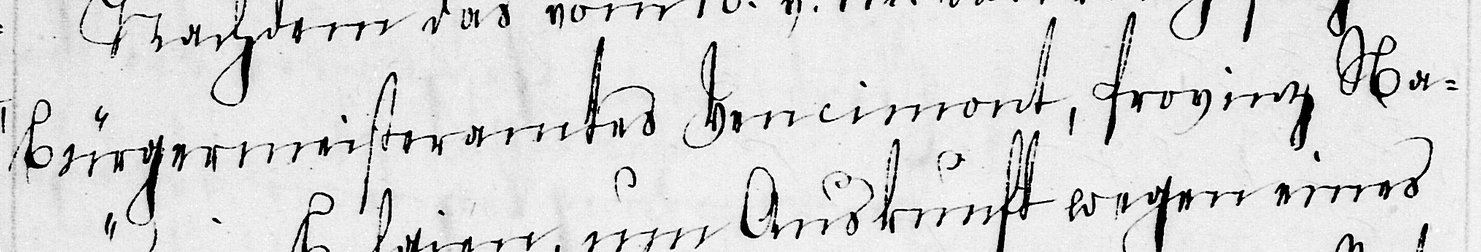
Bürgermeisteramtes Vencimont, Provinz Na¬
